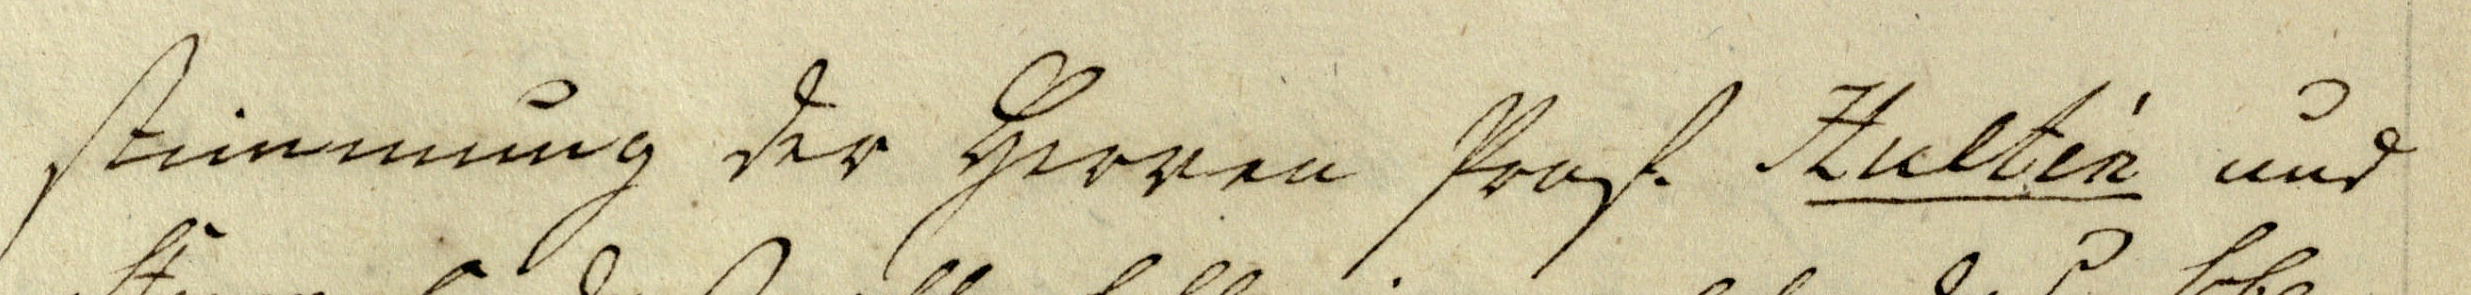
stimmung der Herren Prof. Hultén und
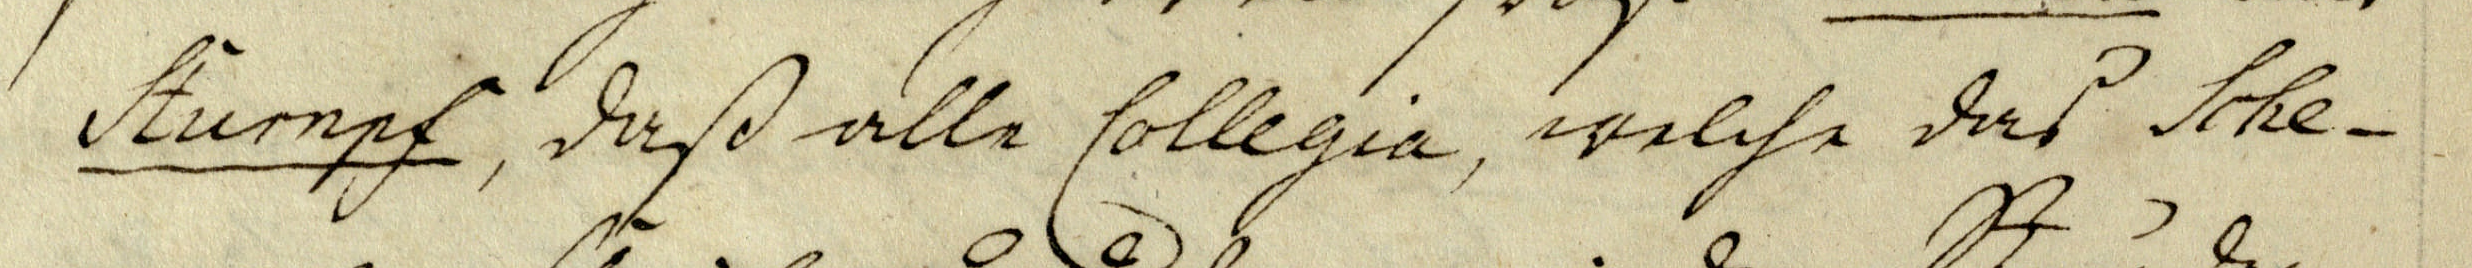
Stumpf, daß alle Collegia, welche das Sche¬
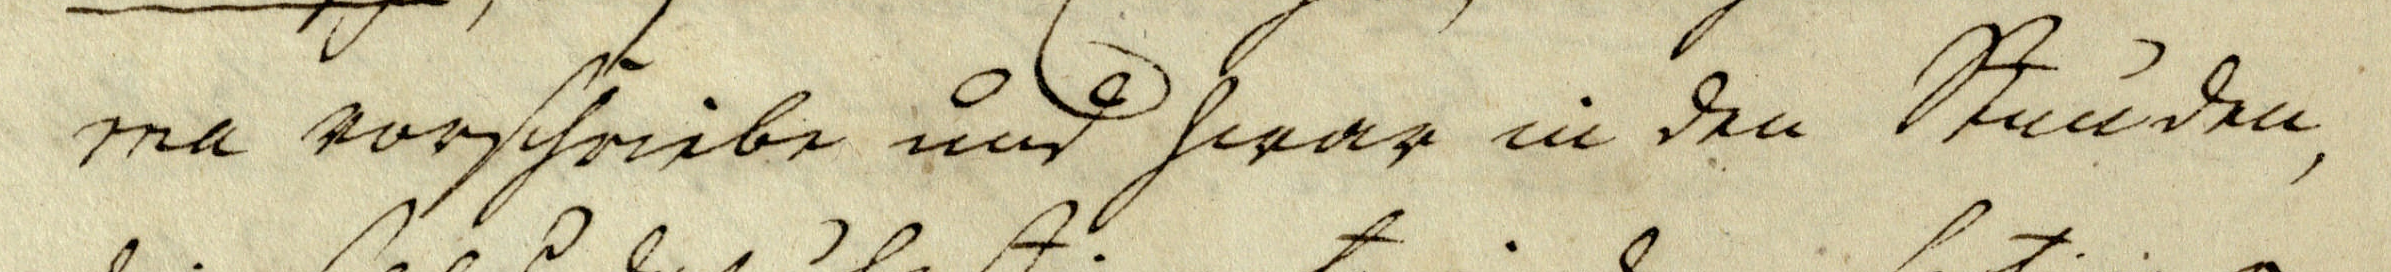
ma vorschriebe und zwar in den Stunden,
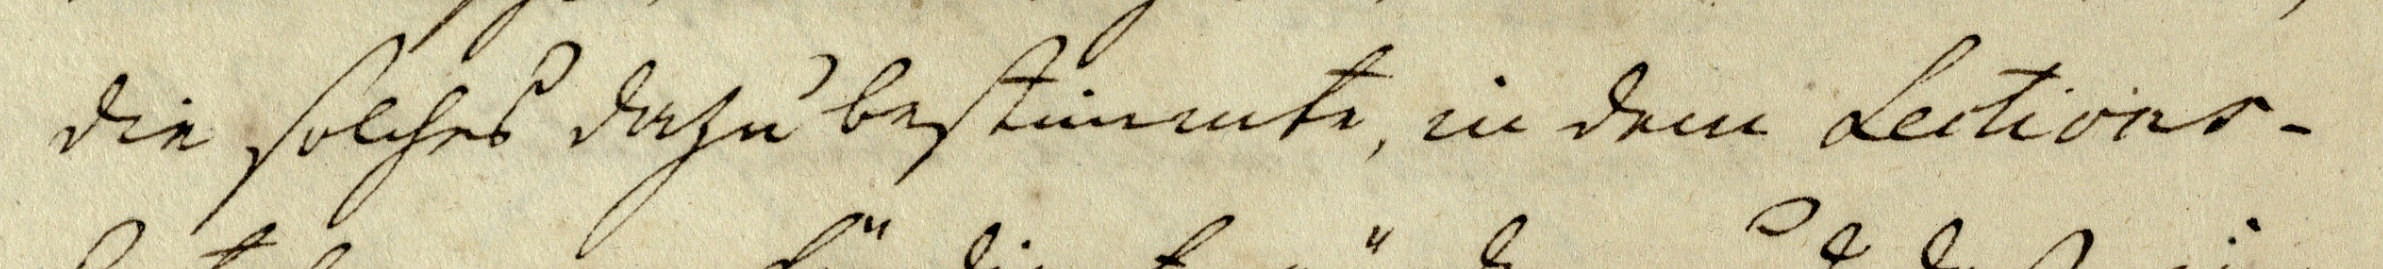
die solches dazu bestimmte, in dem Lections¬
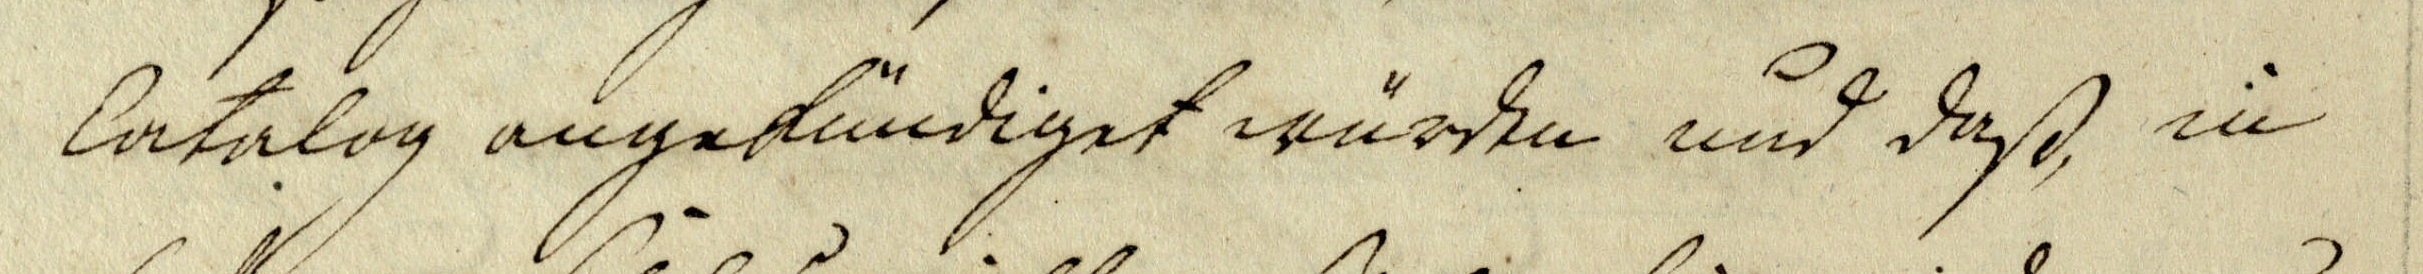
Catalog angekündiget würden und daß in
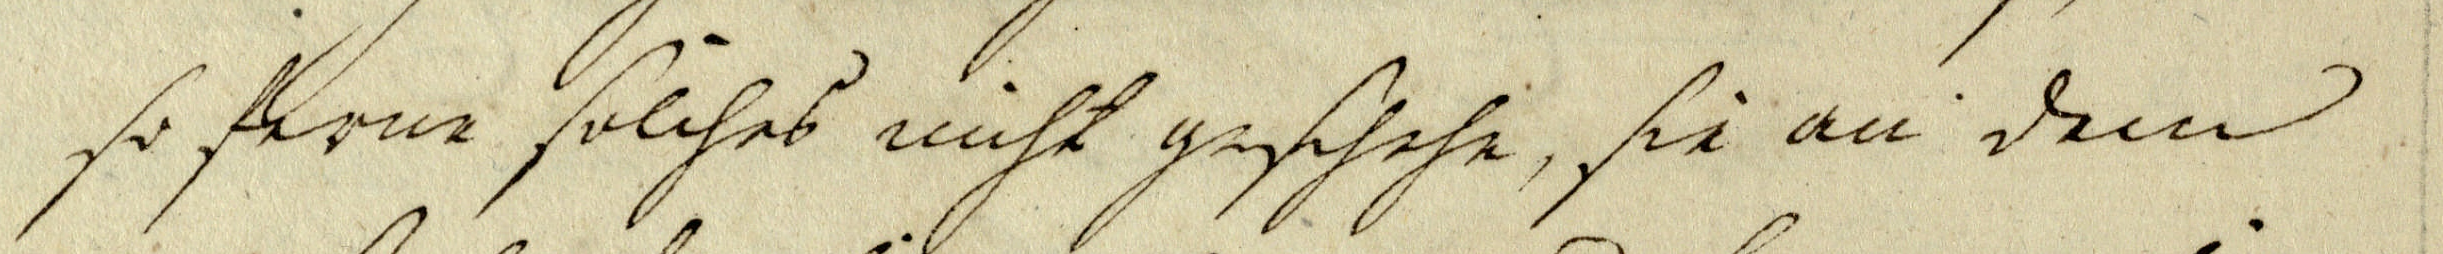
so ferne solches nicht geschehe, sie an dem
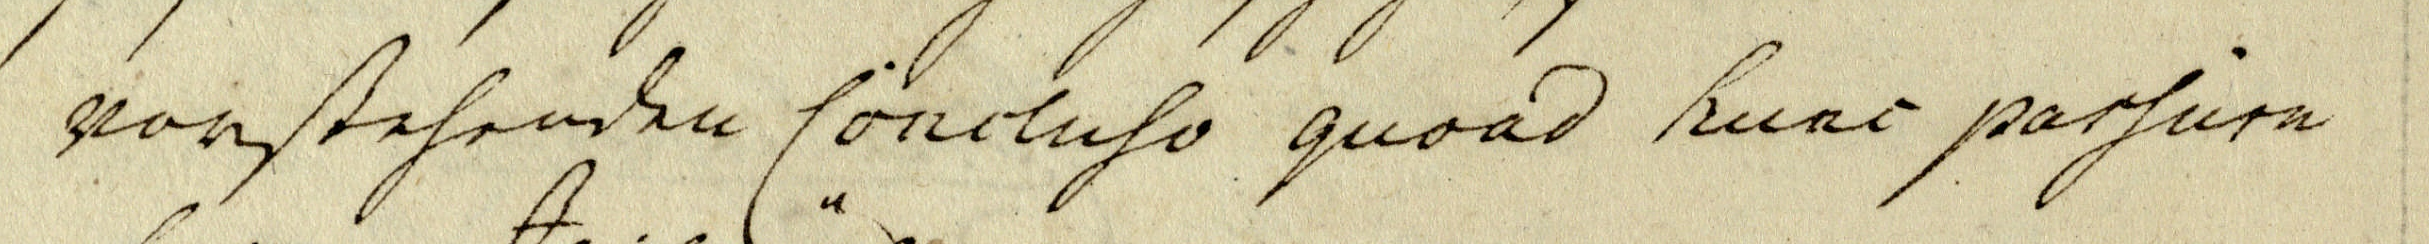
vorstehenden Concluso quoad hunc passum
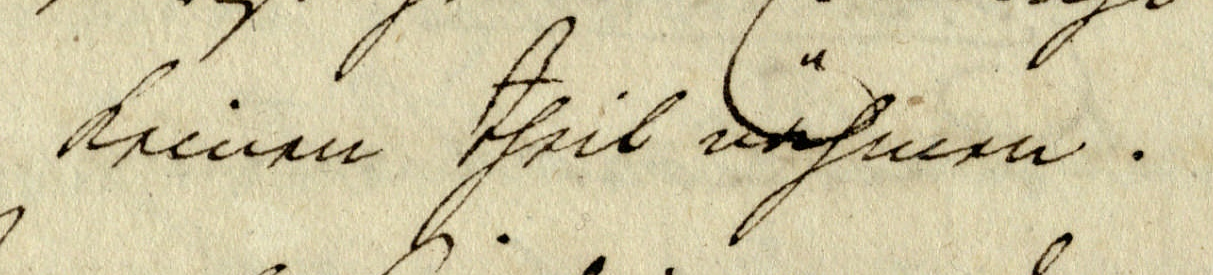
keinen Theil nähmen.
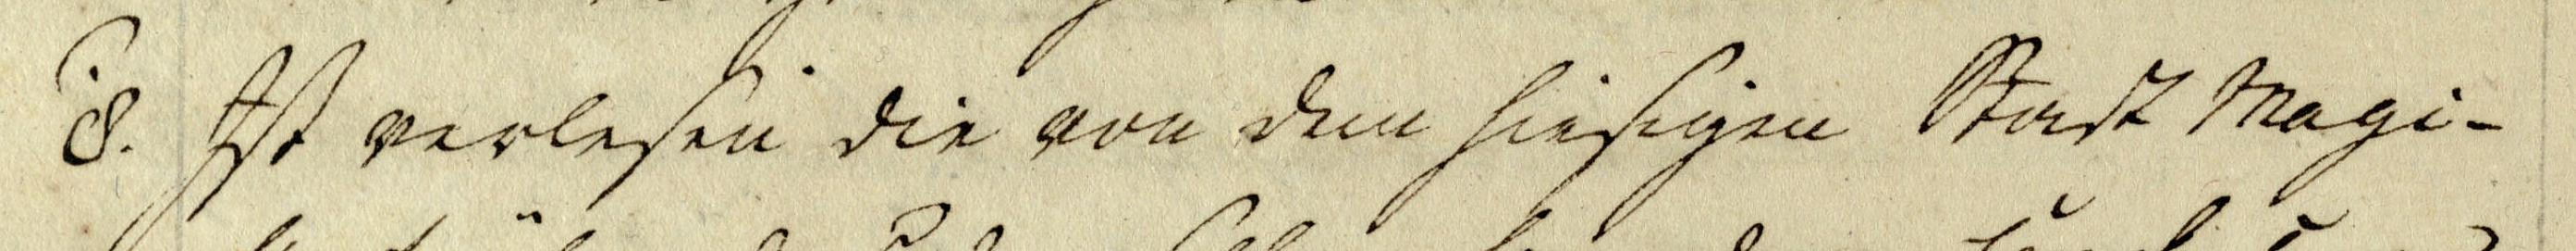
8. Ist verlesen die von dem hiesigen Stadt Magi¬
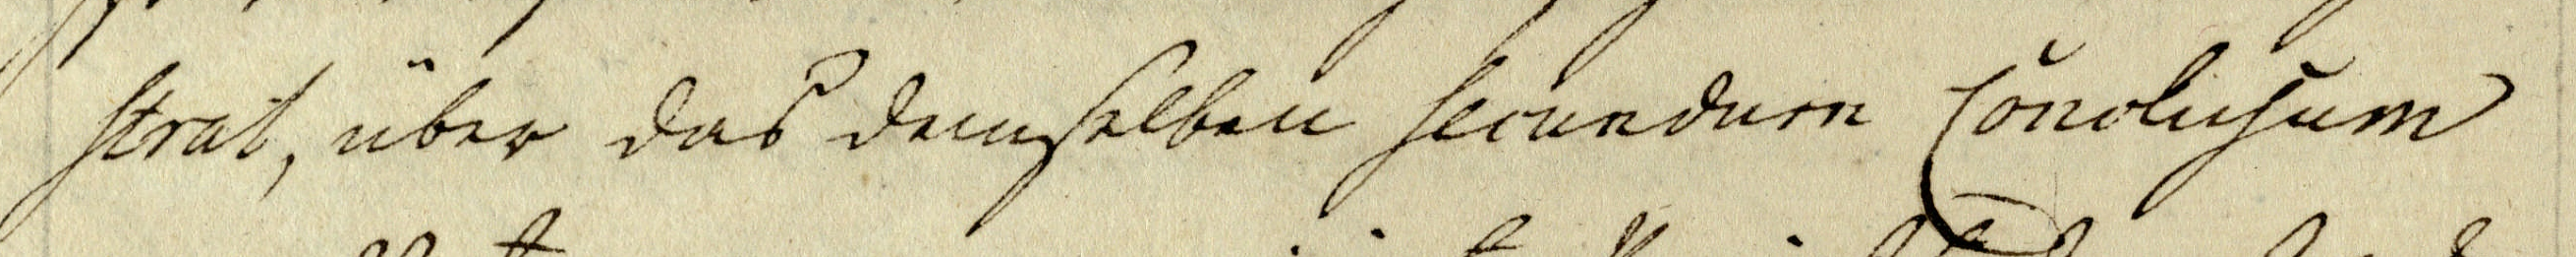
strat, über das demselben secundum Conclusum
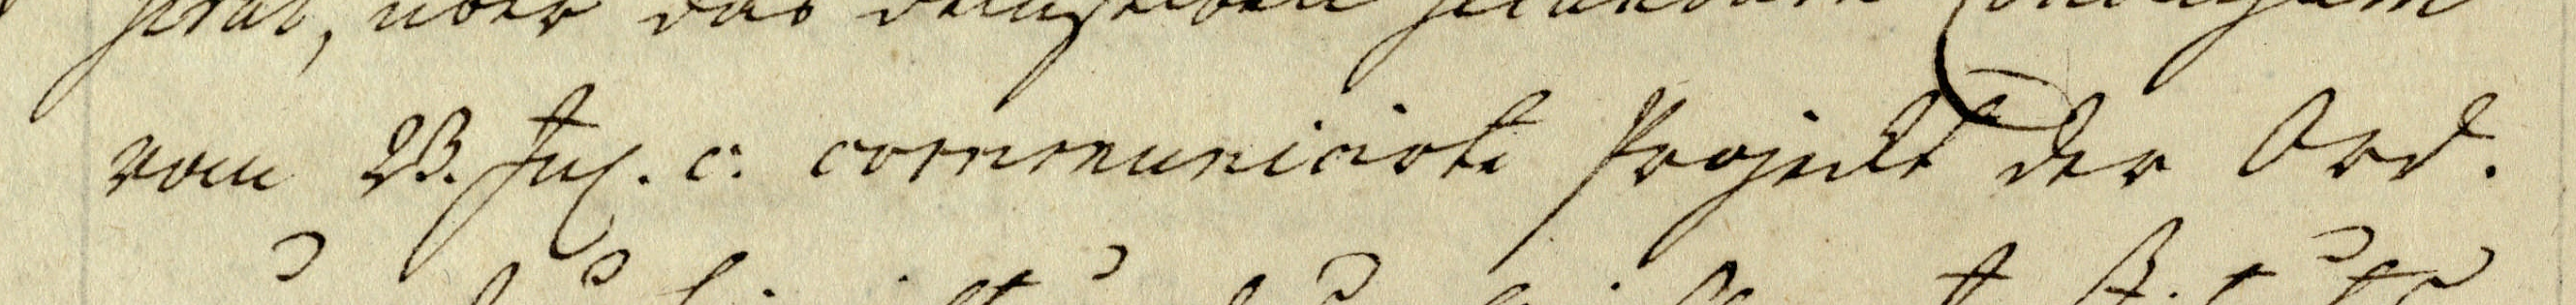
vom 23 Jul. c. communicirte Projeckt der Ord¬
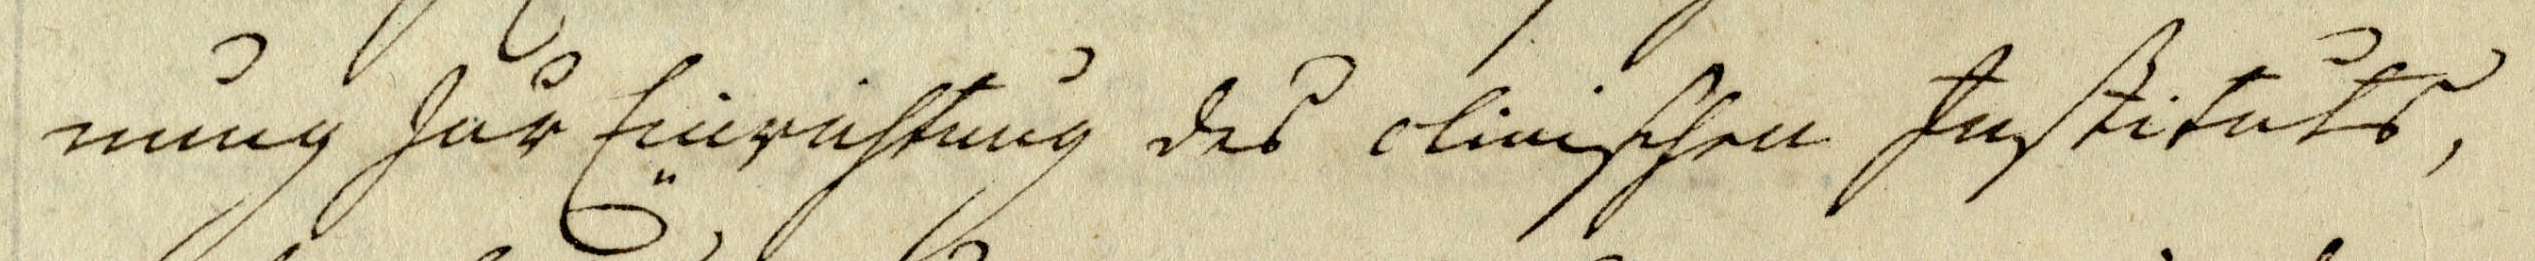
nung zur Einrichtung des clinischen Instituts,
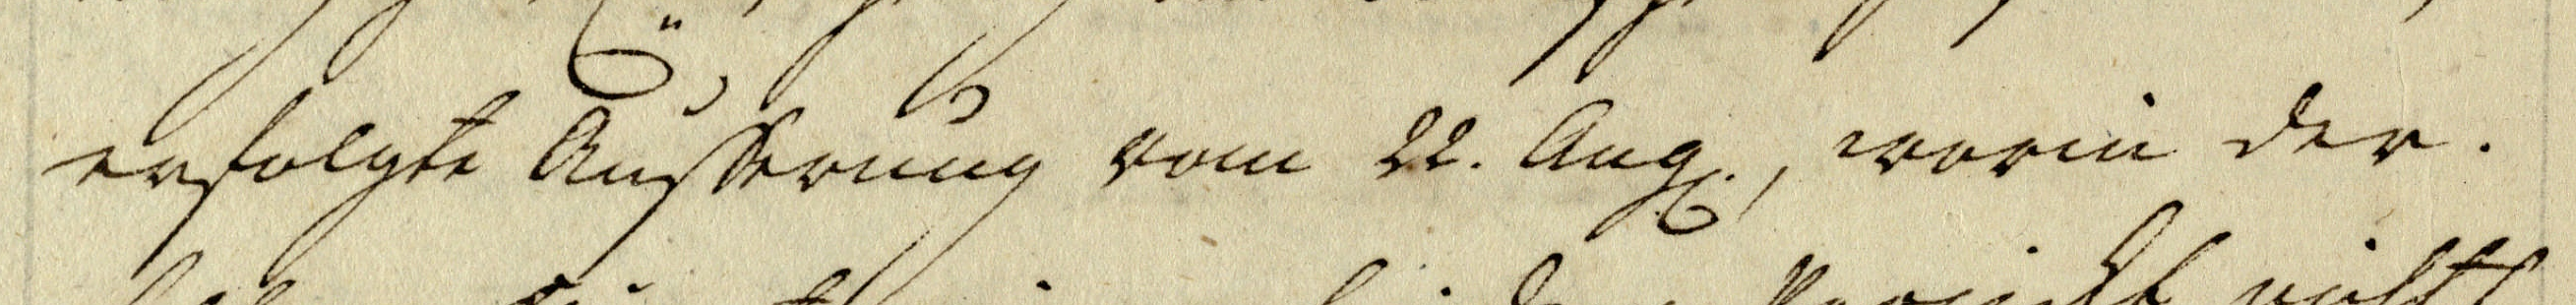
erfolgte Äusserung vom 22. Aug., worin der¬
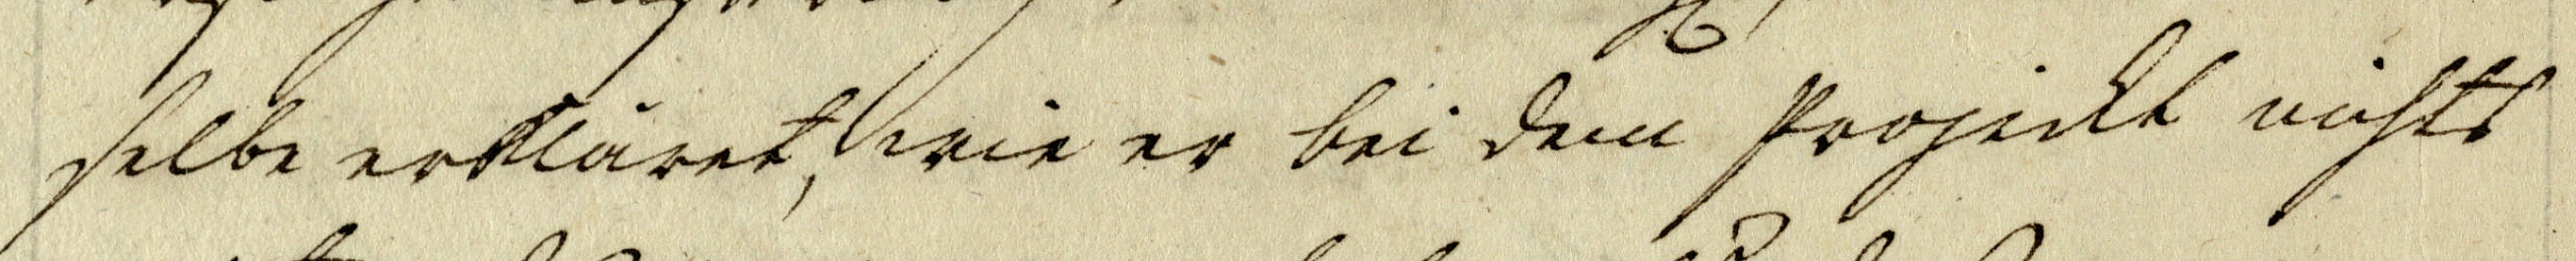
selbe erkläret, wie er bei dem Projeckt nichts
